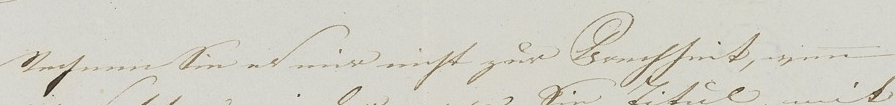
Rechnen Sie es mir nicht zur Frechheit, wenn
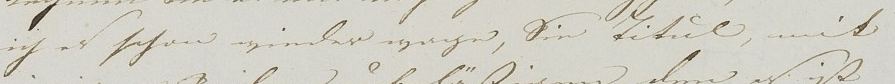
ich es schon wieder wage, Sie Titul, mit
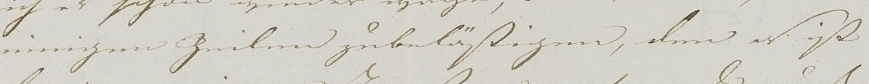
einigen Zeilen zubelästigen, den es ist
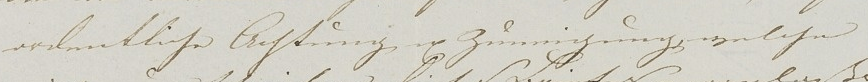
ordentliche Achtung & Zuneigung, welche
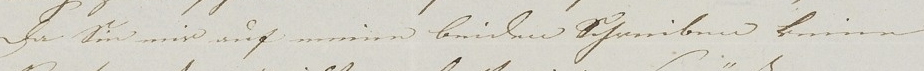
Da Sie mir auf meine beiden Schreiben keine
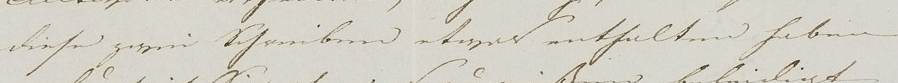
diese zwei Schreiben etwas enthalten haben,
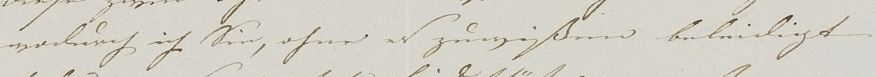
wodurch ich Sie, ohne es zuwißen beleidigt
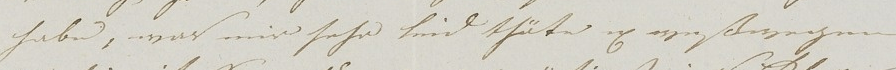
habe, was mir sehr leid thäte & weßwegen
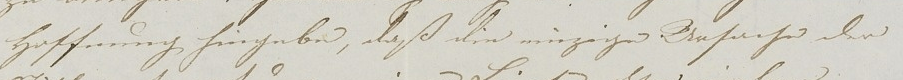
Hoffnung hingebe, daß die einzige Ursache der
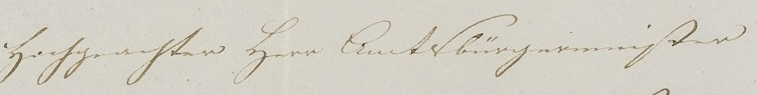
Hochgeachter Herr Amtsbürgermeister
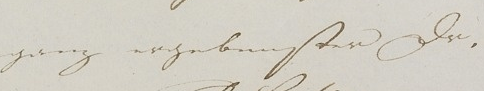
ganz ergebenster Dr.
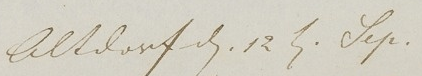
Altdorf d. 12ten Sep.
